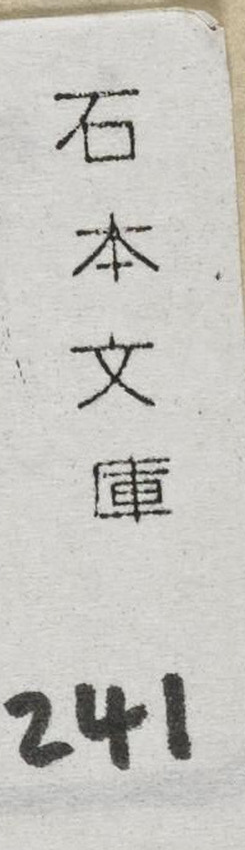石本文庫
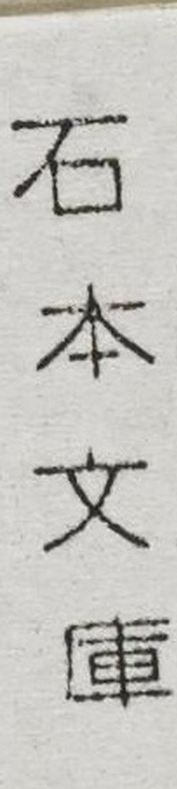石本文庫
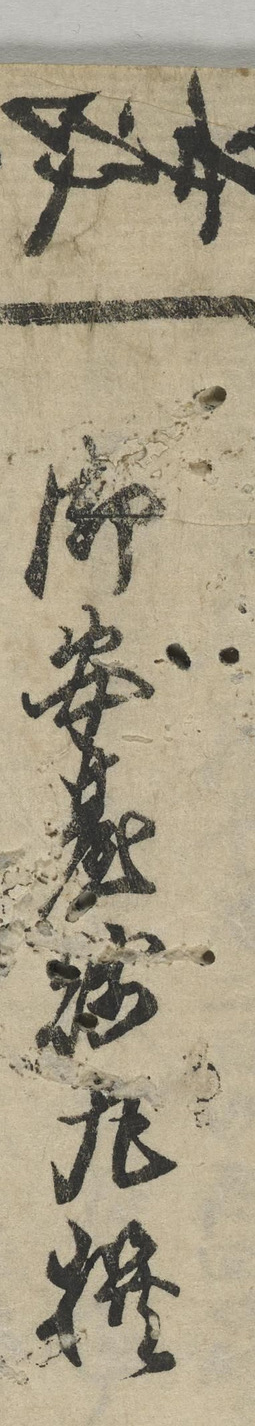御安台賤丸撰
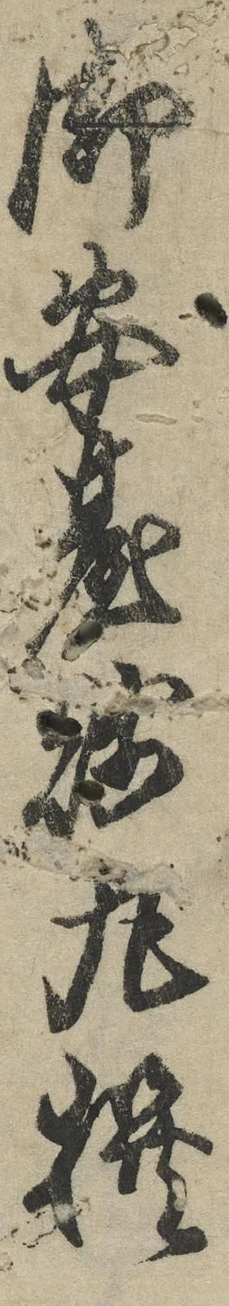御安台賤丸撰
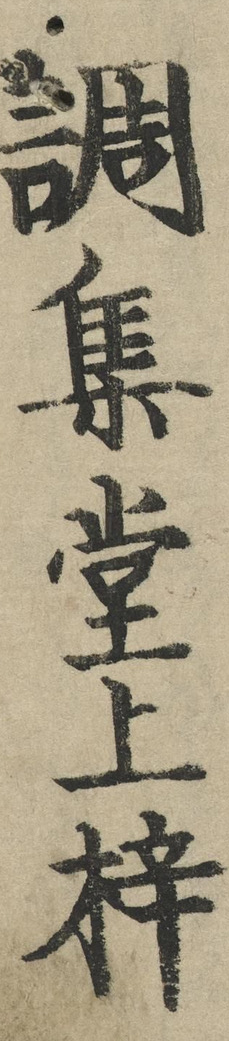調集堂上梓

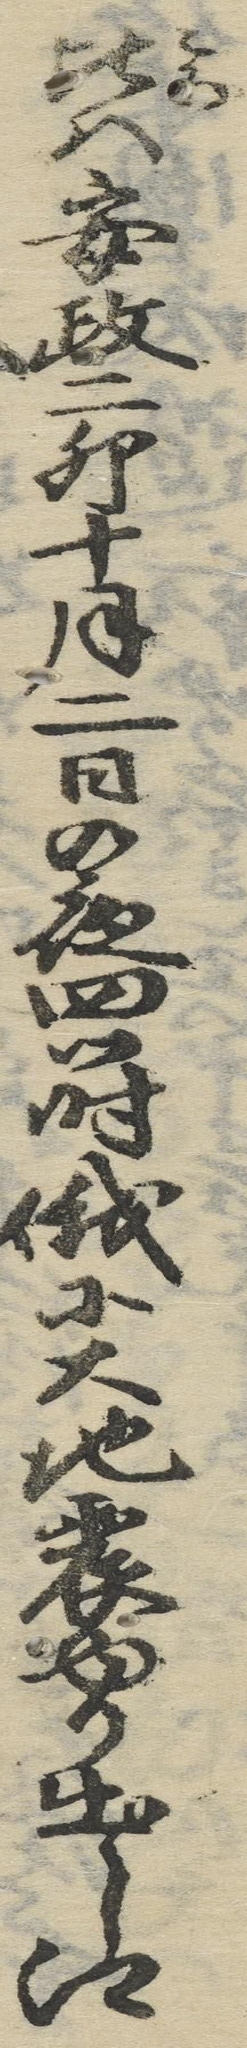比ハ安政二卯十月二日の夜四ッ時俄に大地震ゆり出し江
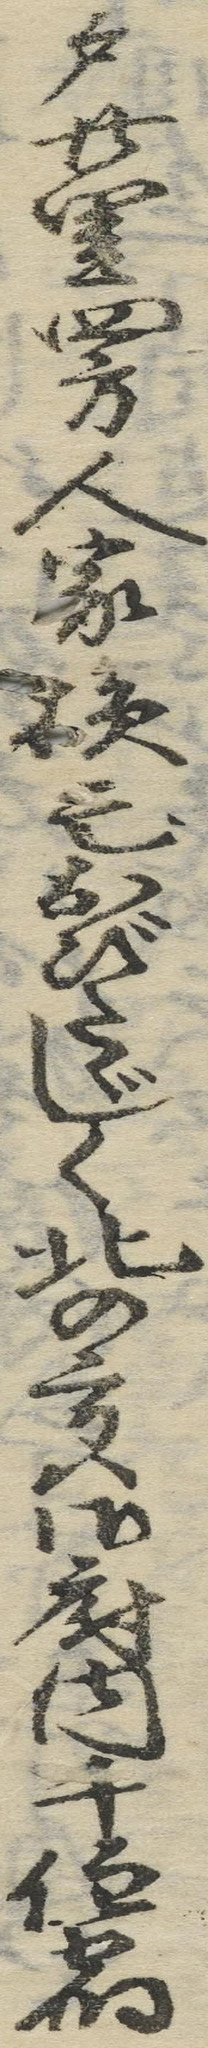戸廿里四方人家損亡おびたゞしく北の方ハ御府内千住宿
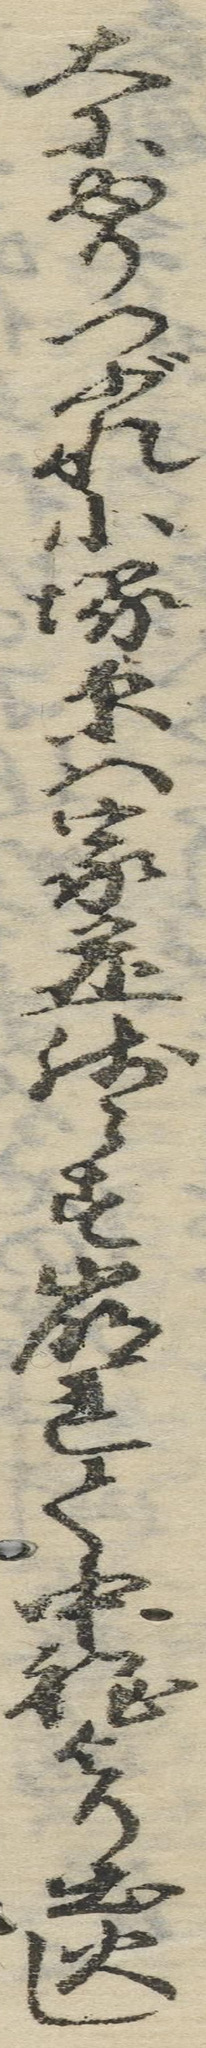大にゆりつぶれ小塚原ハ家並残らす崩れて中程より出火し
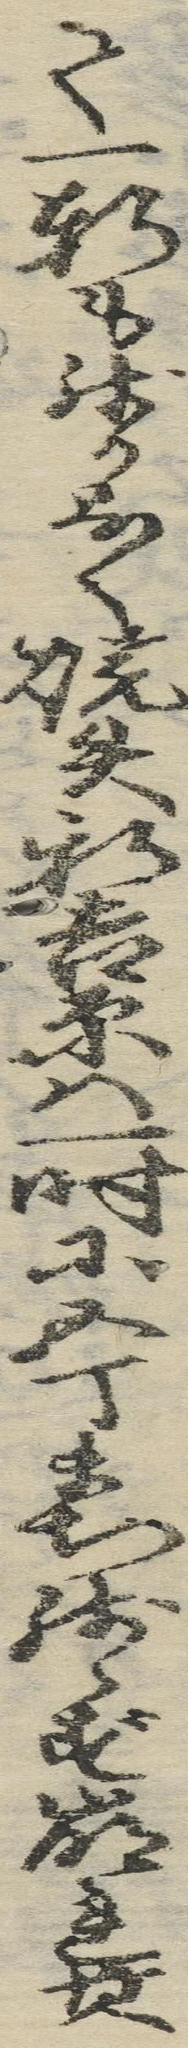て一軒も残りなく焼失新吉原ハ一時に五丁まち残らず崩れ其
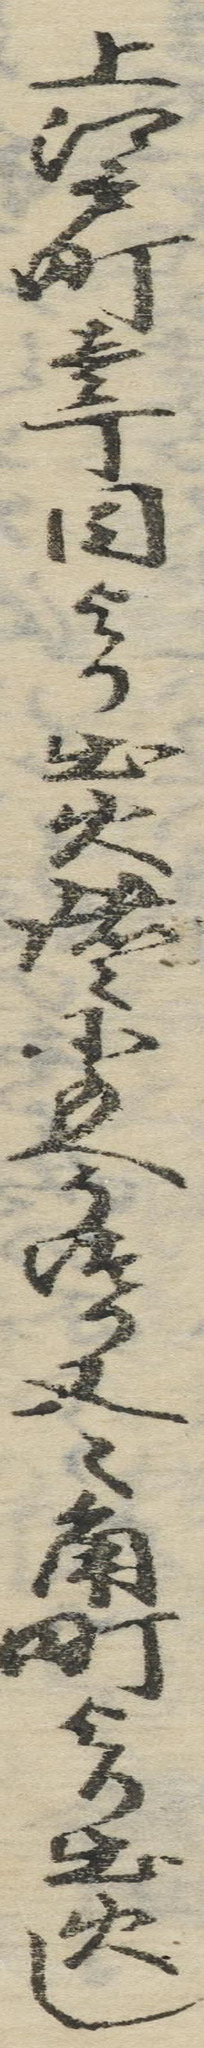上江戸町壱丁目より出火諸々にもへうつり又々南町より出火し
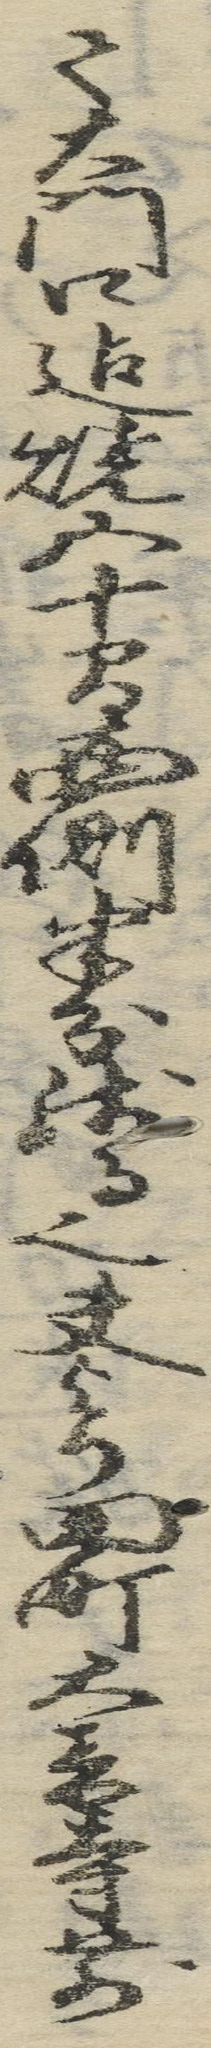て大門口迄焼五十間西側半分残る也夫より田町大京？寺前
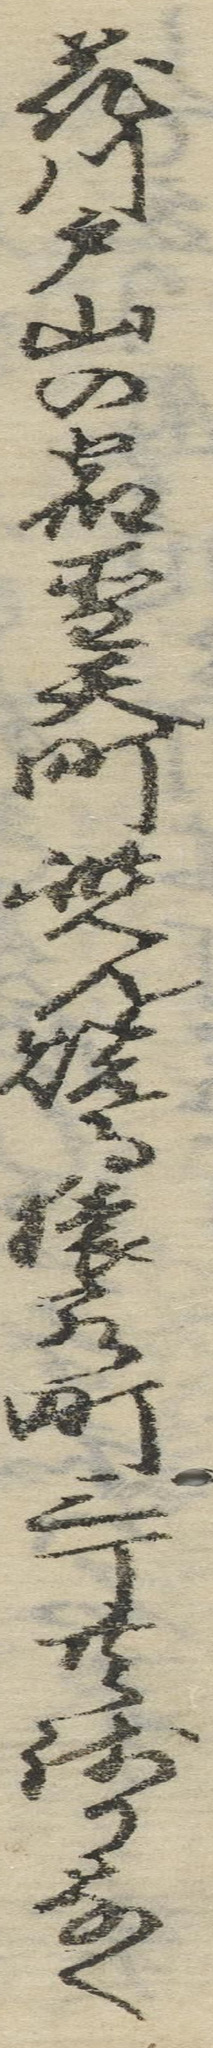花川戸山の宿聖天町此へん焼る猿若町三丁共残りなく
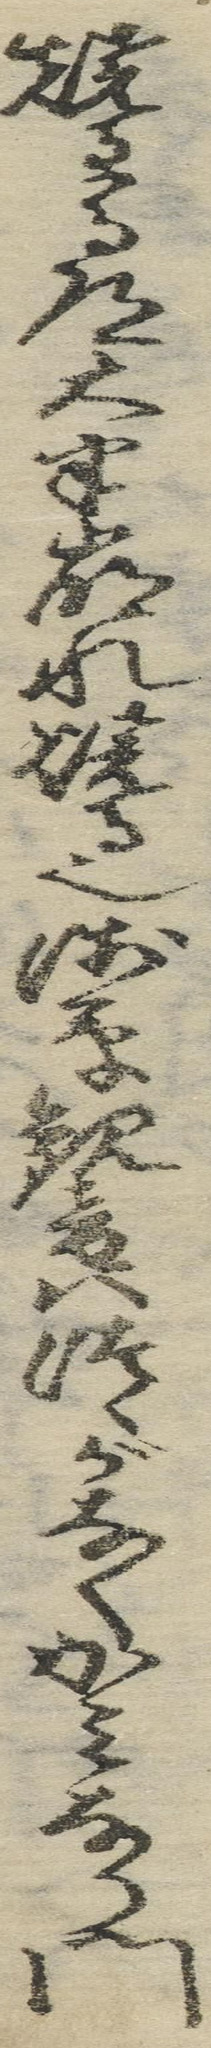焼る間道大半崩れ焼る也浅草観音ハつゝがなくかミなり門
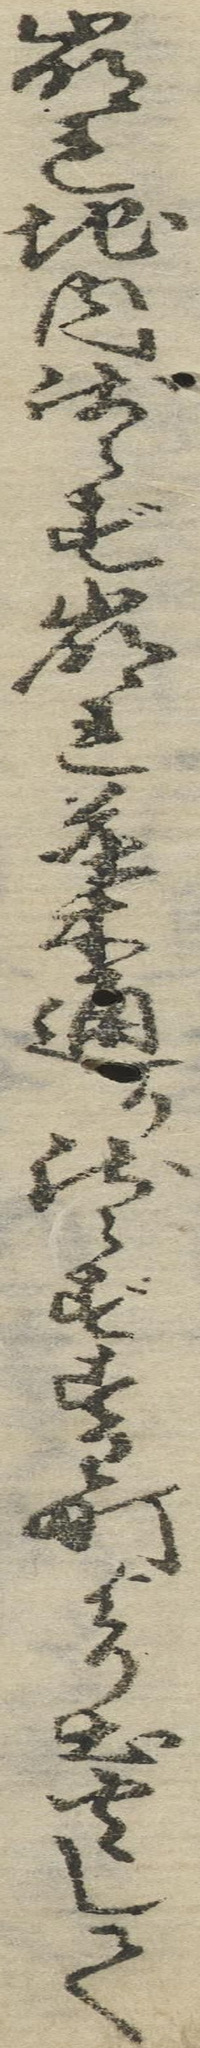崩れ地内残らず崩れ並木通り残らずすわ町より出火して
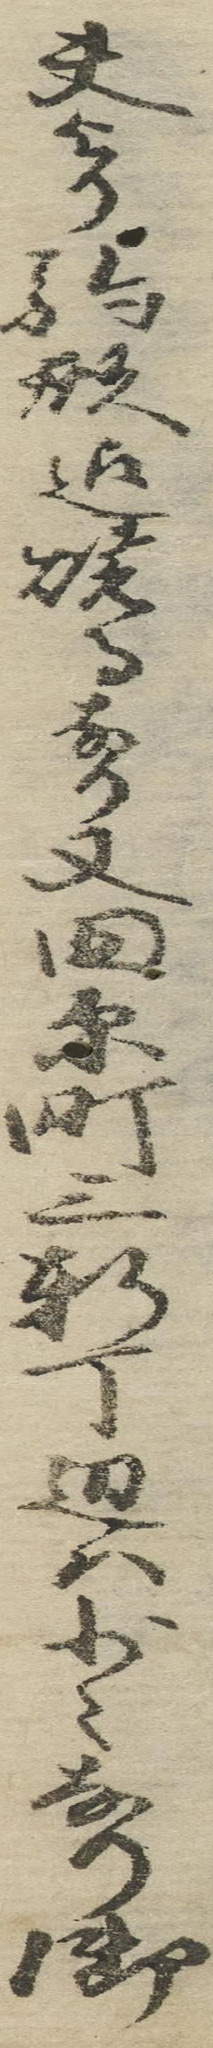夫より駒形迄焼るなり又田原町三軒丁辺ハ少々なり御

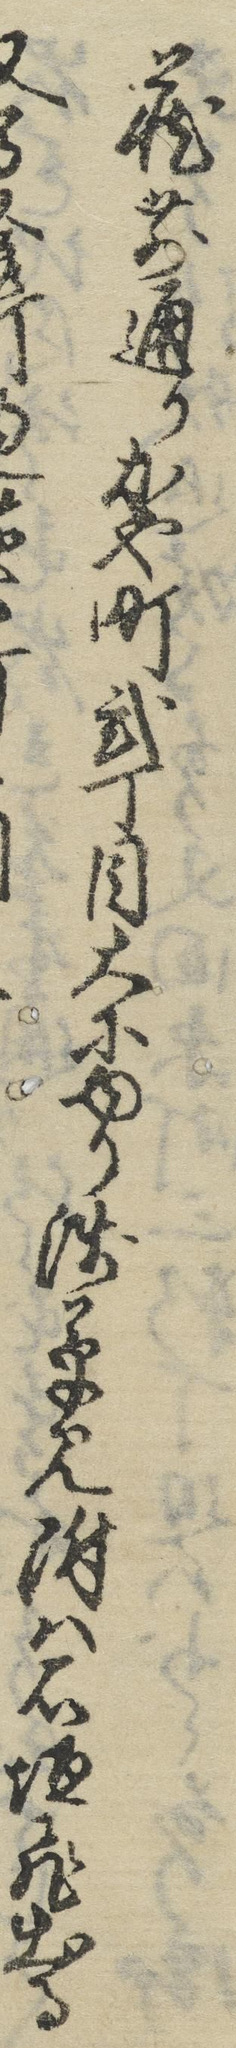蔵前通りかや町弐丁目大にゆり浅草見附ハ石垣飛出る
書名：御府内五街道　大地しん
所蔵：東京大学地震研究所図書室 Earthquake Research Institute Library, The University of Tokyo, JAPAN
